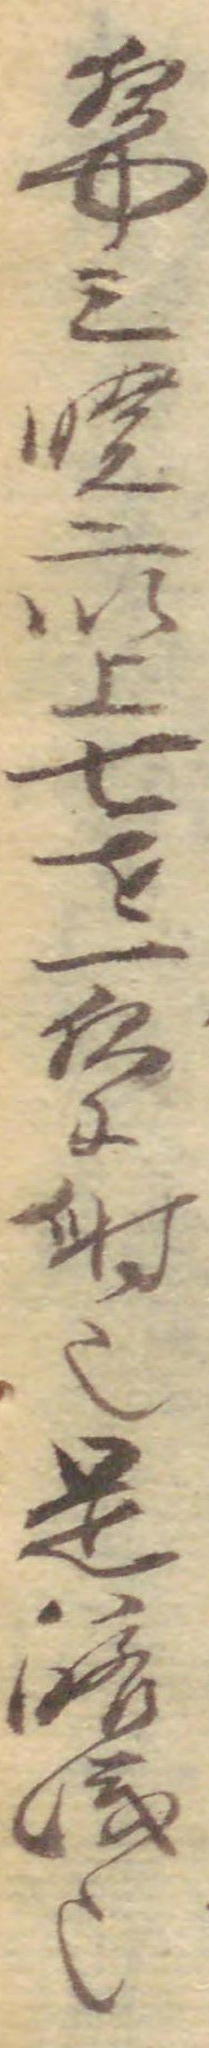夜中三暁二以上七を一夜に射也是ハ略儀也

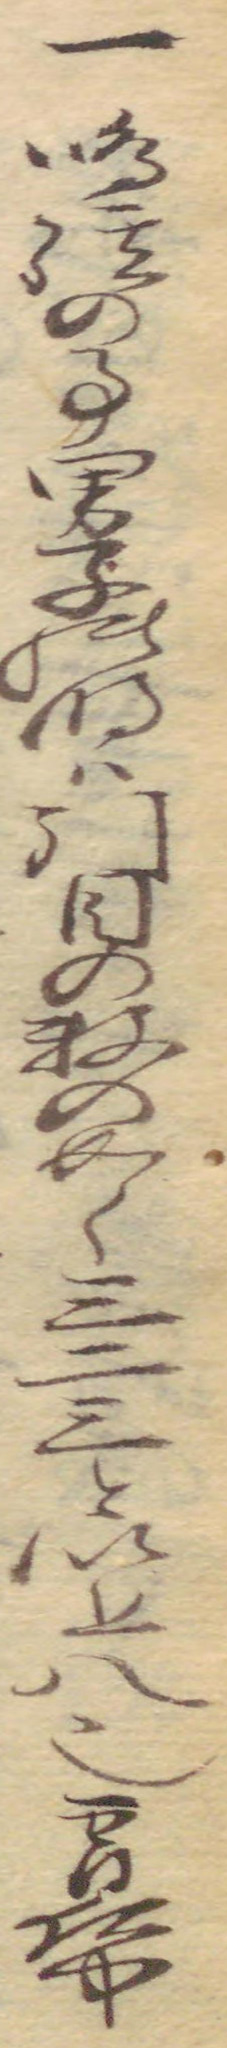一鳴弦の事男子の時ハ引目の数の如く三二三と以上八也宵夜中
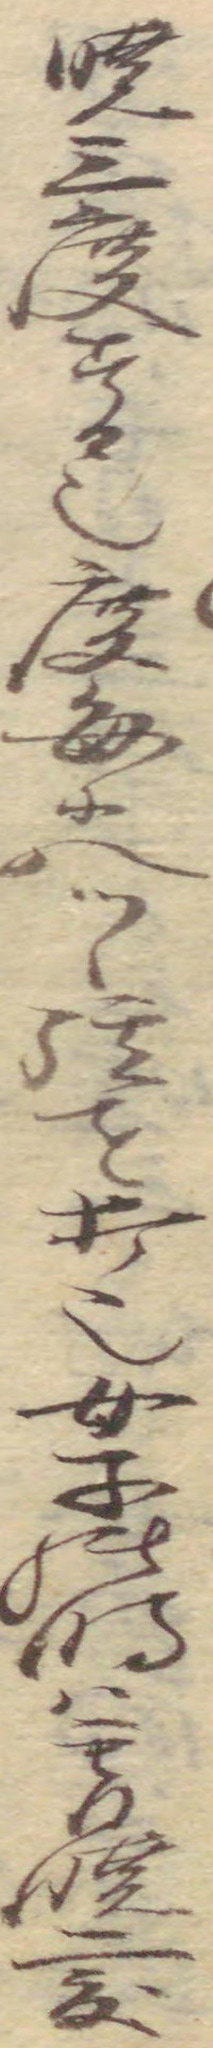暁三度する也度毎に八ツヽ弦を打也女子の時ハ宵暁二度
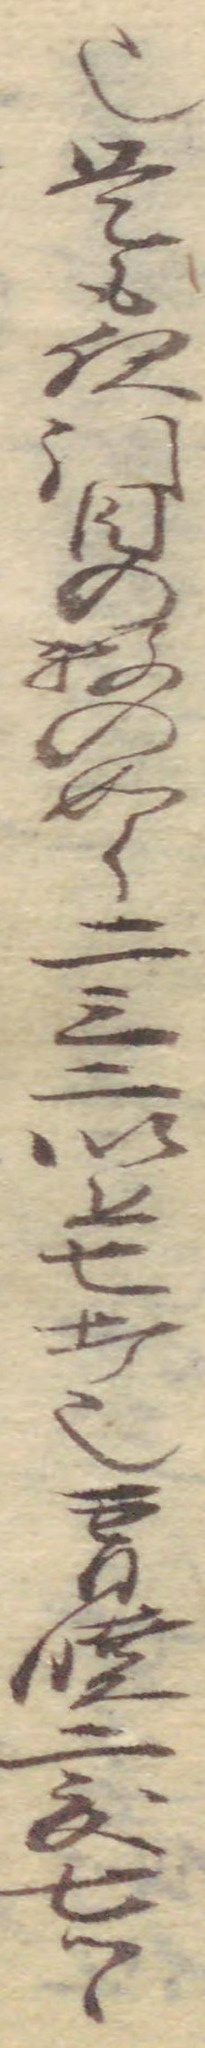也これも夜引目の数の如く二三二以上七打也宵暁二度七ツヽ
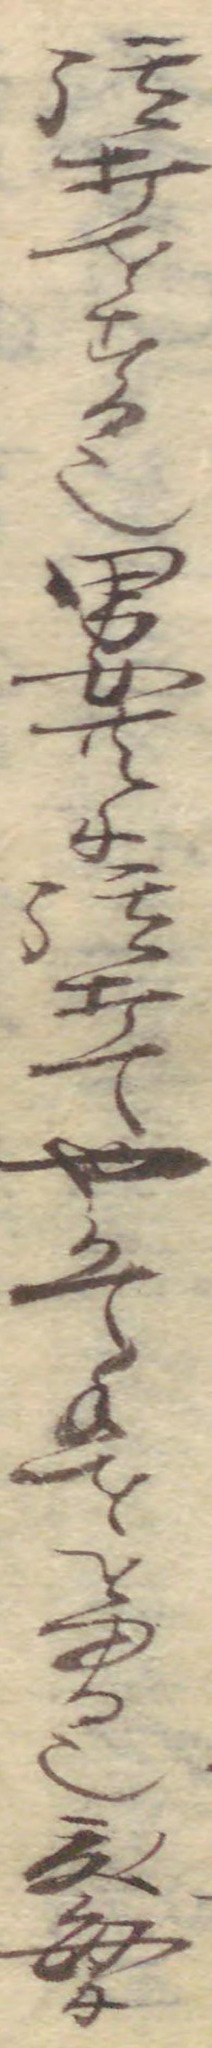弦打をする也男女共に弦打てやかて手をそゆる也度毎に
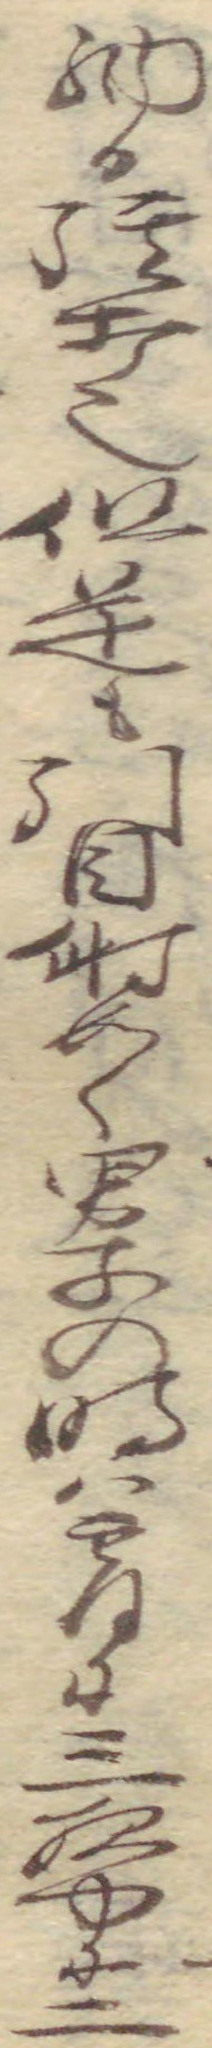納る弦打也但是も引目射如く男子の時ハ宵に三夜中に二
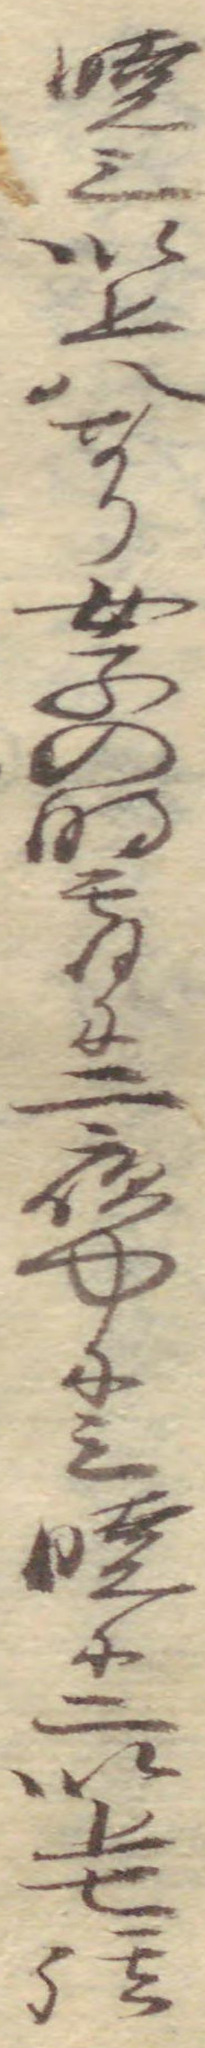暁三以上八なり女子の時宵に二夜中に三暁に二以上七弦
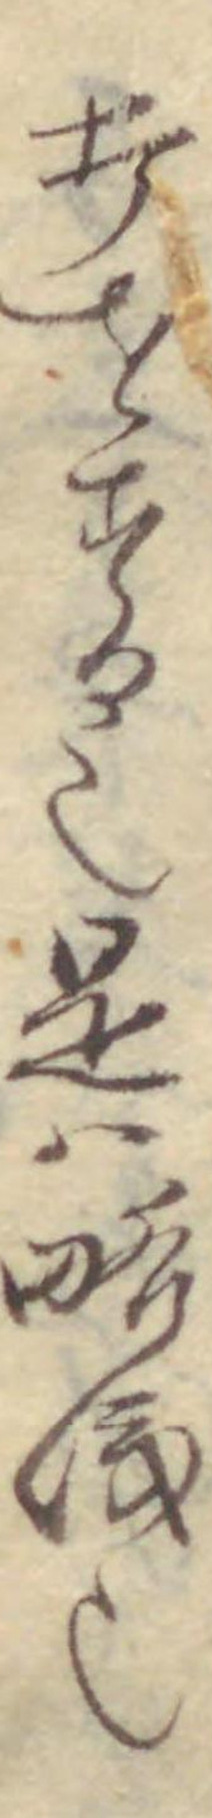打をする也是ハ略儀也
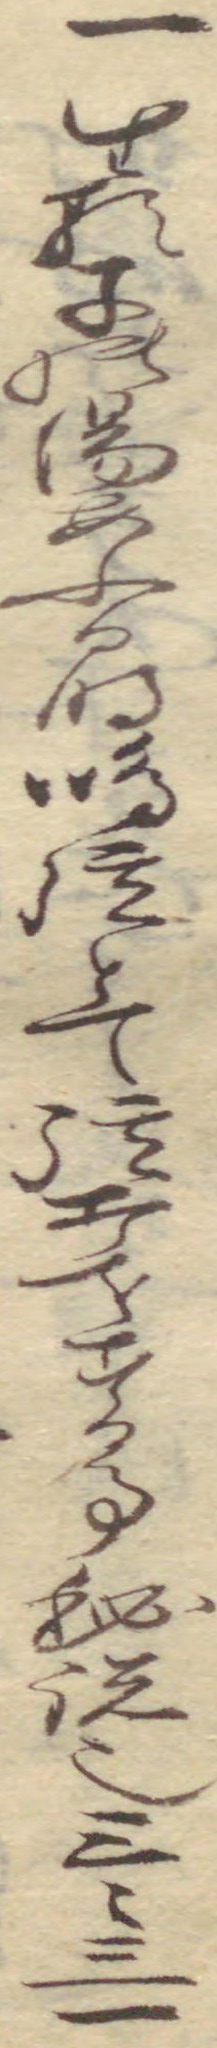一生る子の湯あふる時鳴弦とて弦打をする事秘説也三々三一
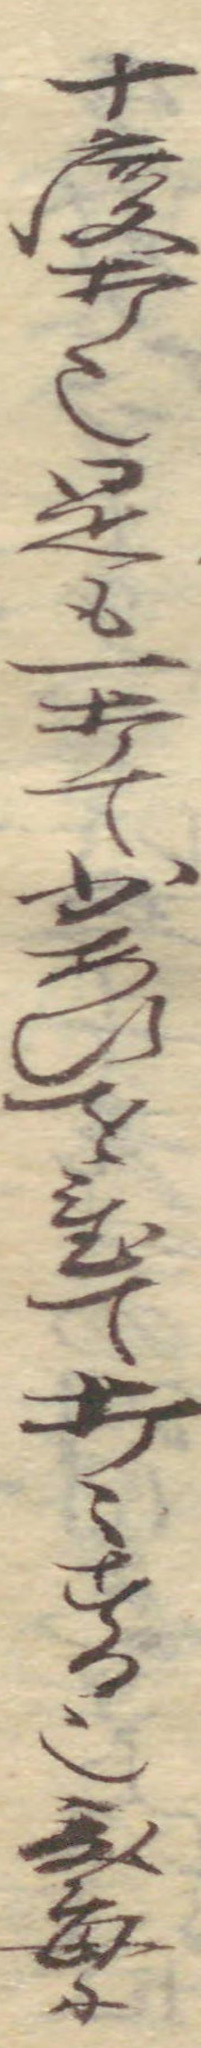十度打也是も一打て少あひを置て打々する也度毎に
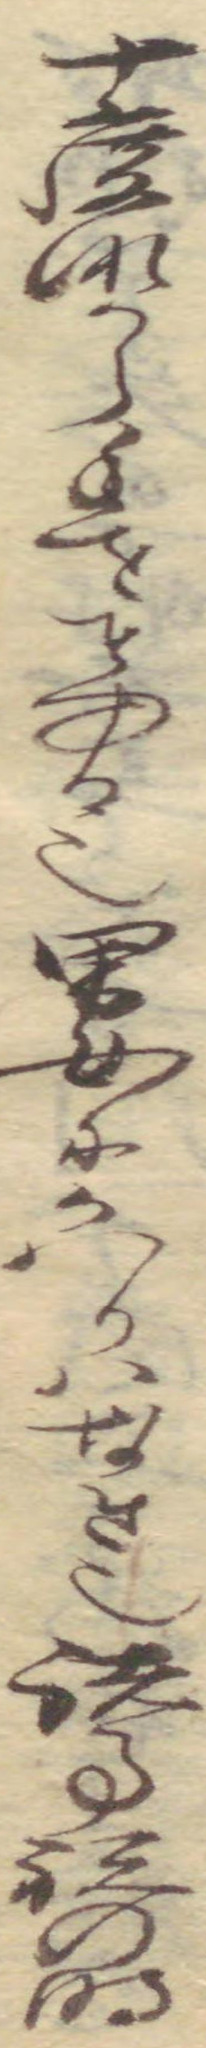十度なから手をそゆる也男女にかハりハなき也諸事祝の時
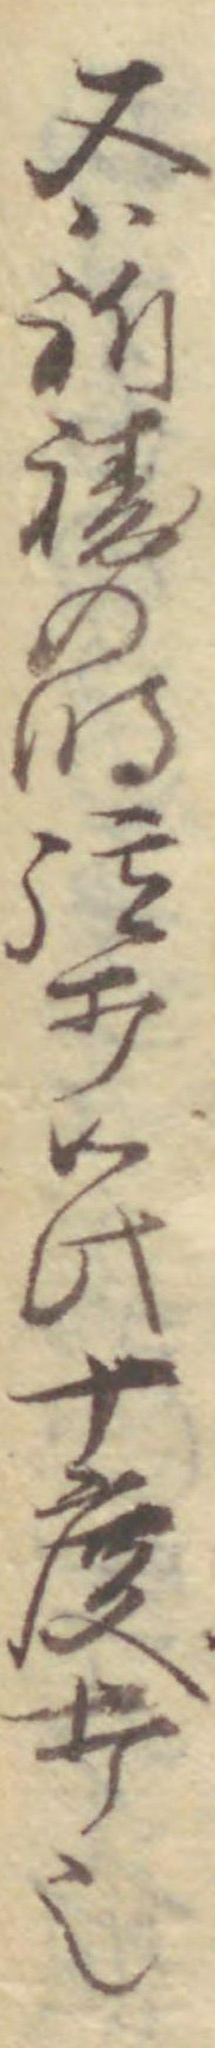又ハ祈禱の時弦打如此十度打也
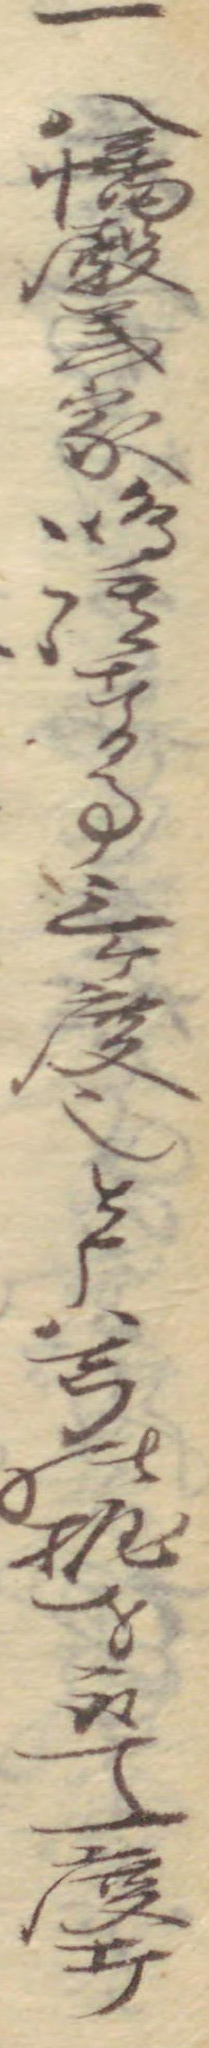一八幡殿義家鳴弦する事三ケ度也と申ハ弓の握を取て一度打
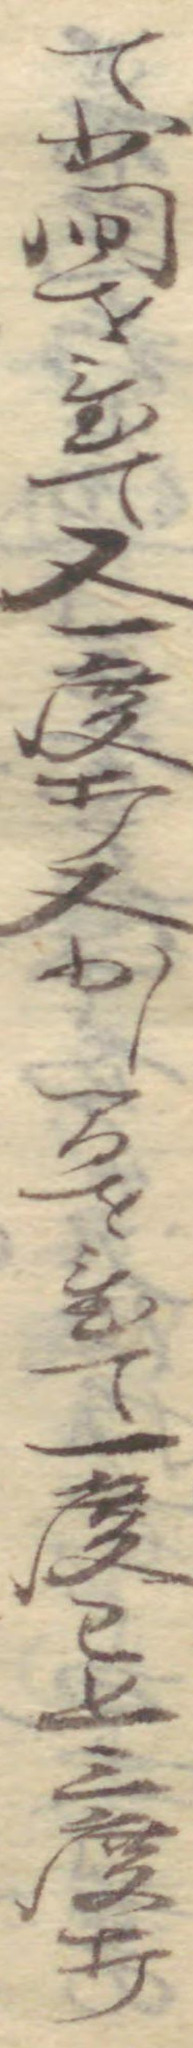て少間を置て又一度打又少し間を置て一度已上三度打
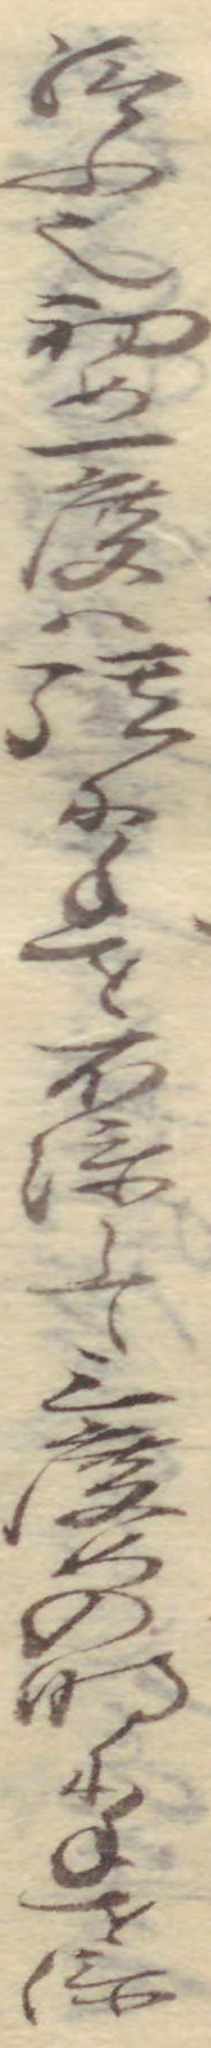給ふ也初め一度ハ弦に手を不添して三度めの時に手を添
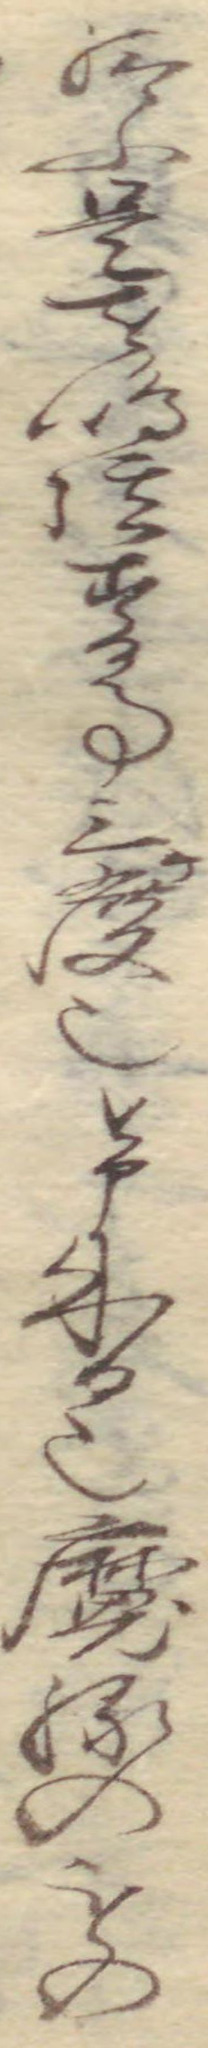給ふ是を鳴弦する事三度也と申来る也魔縁のもの
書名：鶯宿雑記. 巻199-200
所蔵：国立国会図書館 National Diet Library, JAPAN
